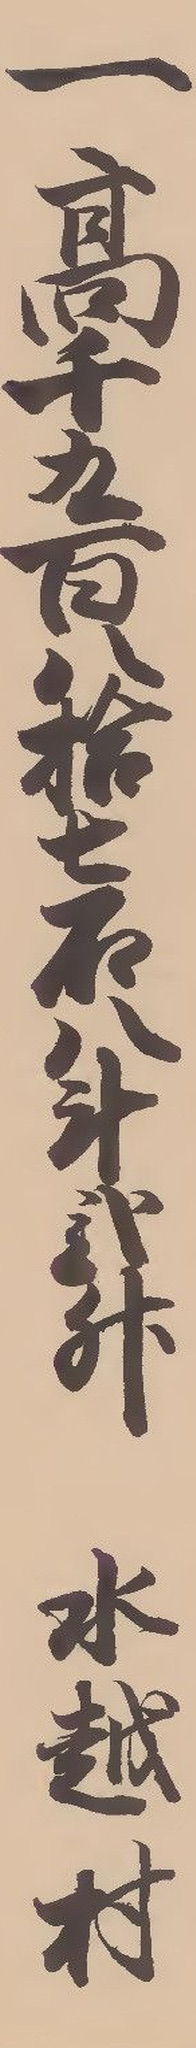一高千九百八拾七石八斗弐升水越村

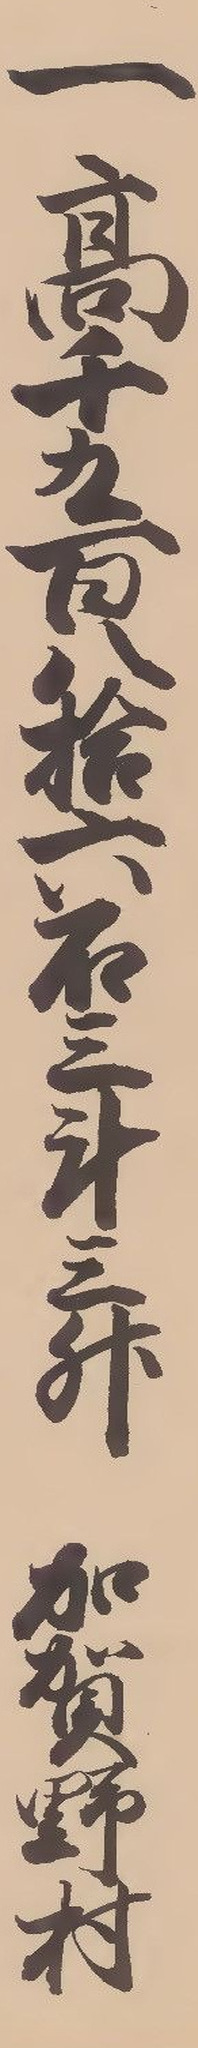一高千九百八拾六石三斗三升加賀野村
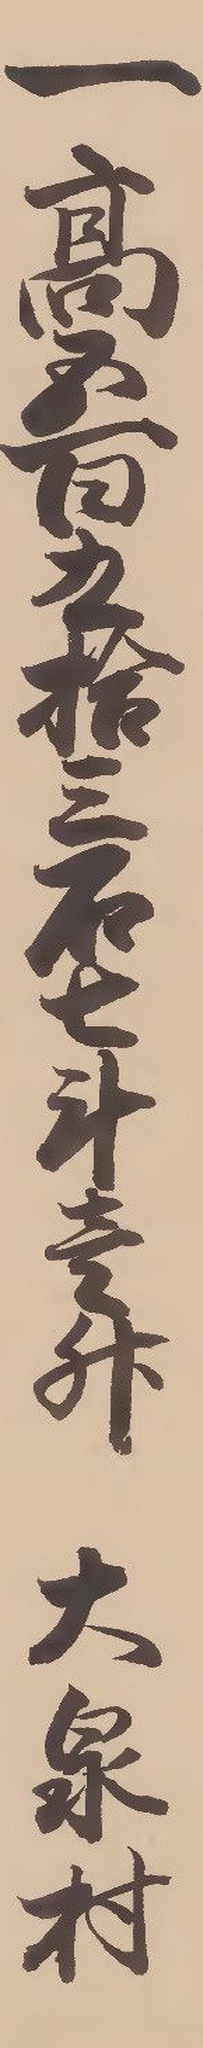一高五百九拾三石七斗壱升大泉村
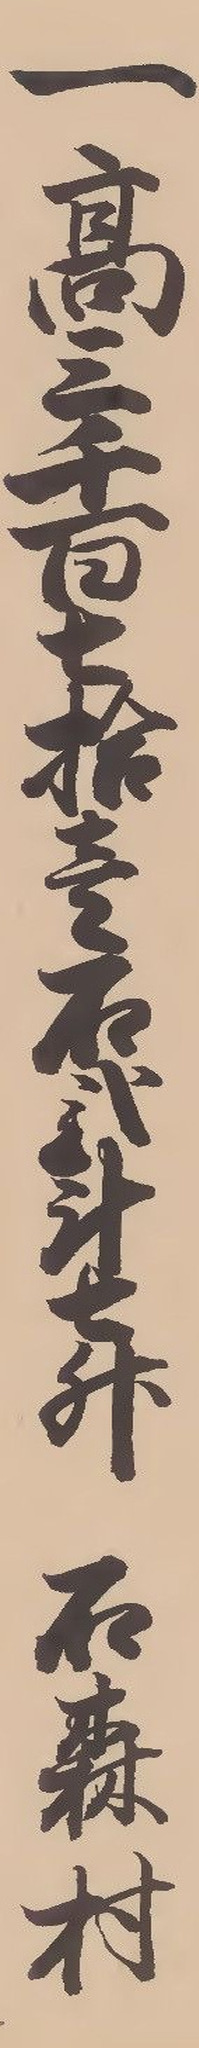一高三千百七拾壱石弐斗七升石森村
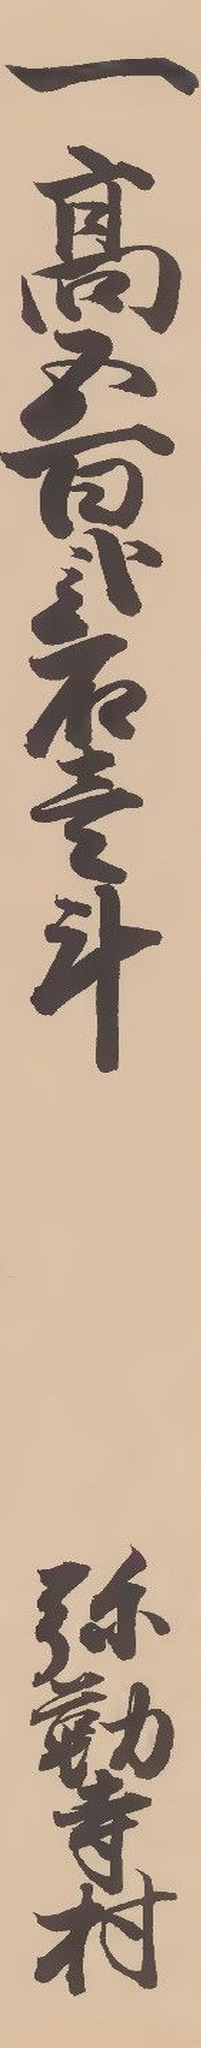一高五百弐石壱斗弥勒寺村
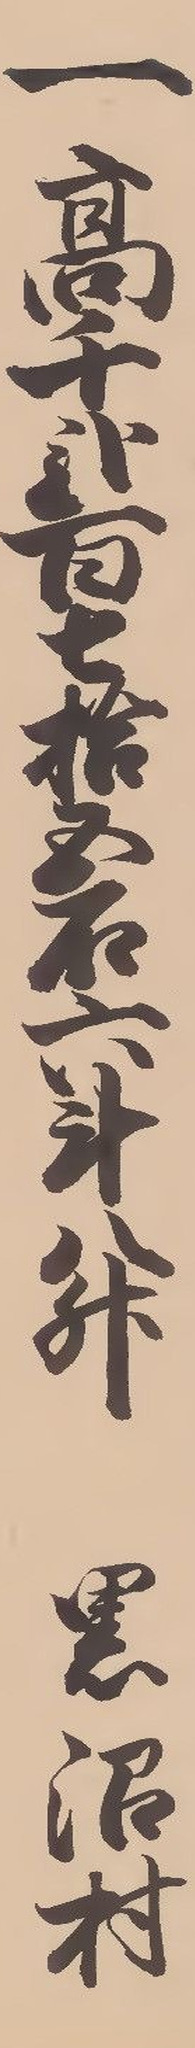一高千弐百七拾五石六斗八升黒沼村
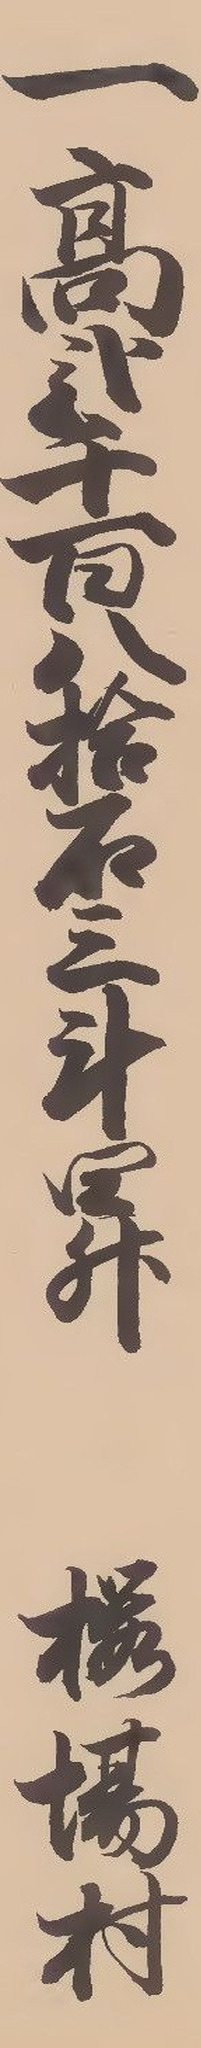一高弐千百八拾石三斗四升桜場村
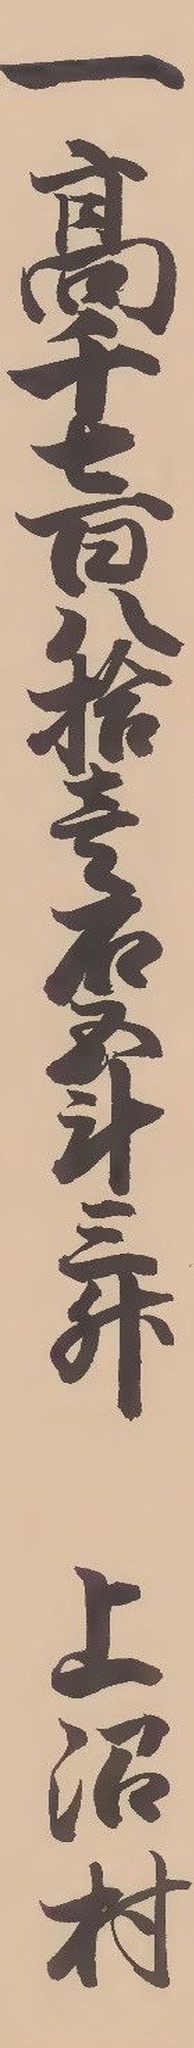一高千七百八拾壱石五斗三升上沼村
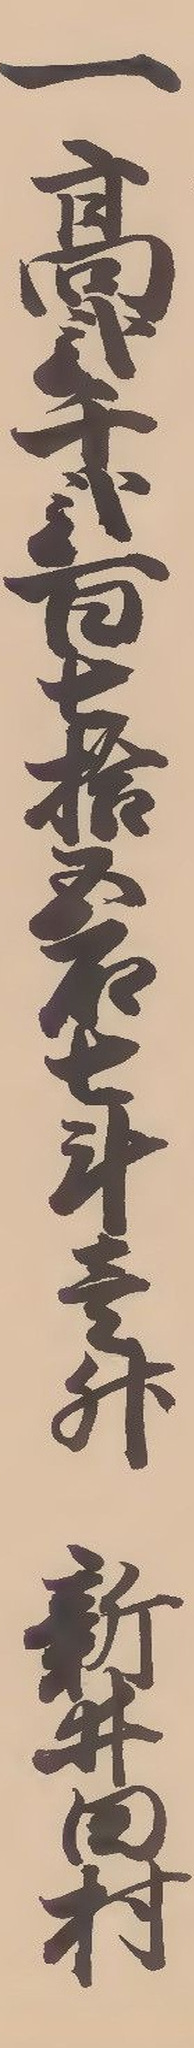一高弐千弐百七拾五石七斗壱升新井田村

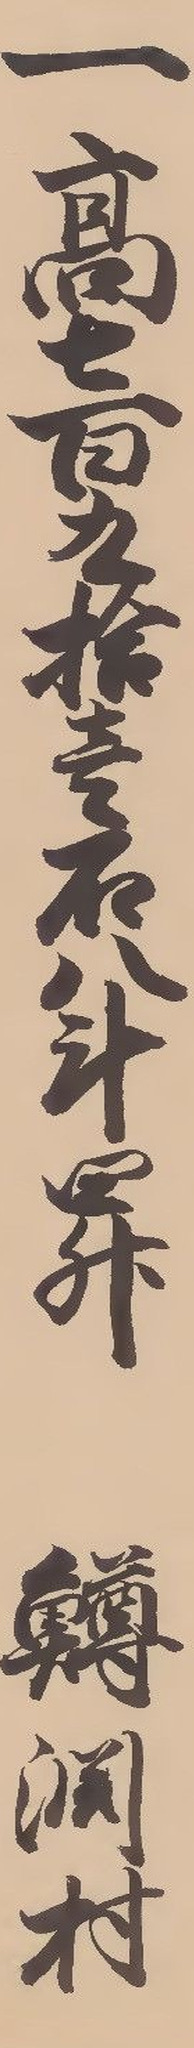一高七百九拾壱石八斗四升鱒淵村
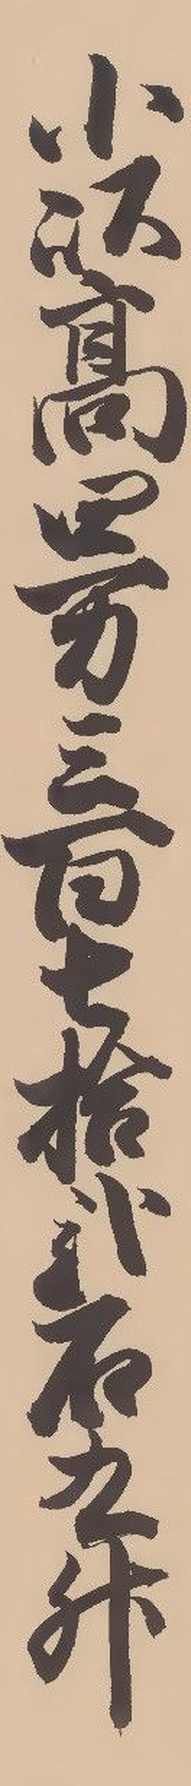小以高四万三百七拾弐石九升
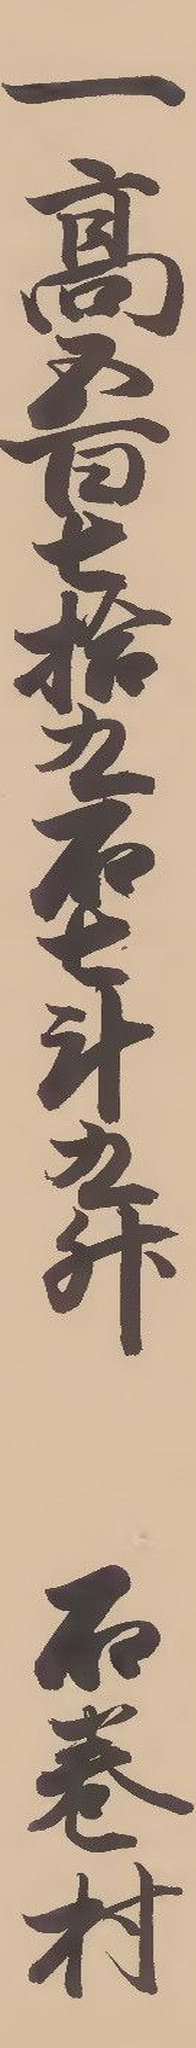一高五百七拾九石七斗九升石巻村
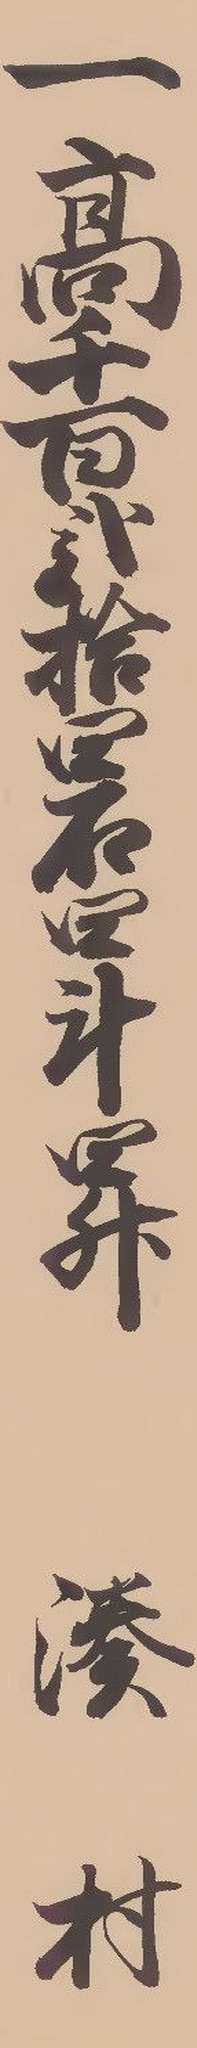一高千百弐拾四石四斗四升湊村
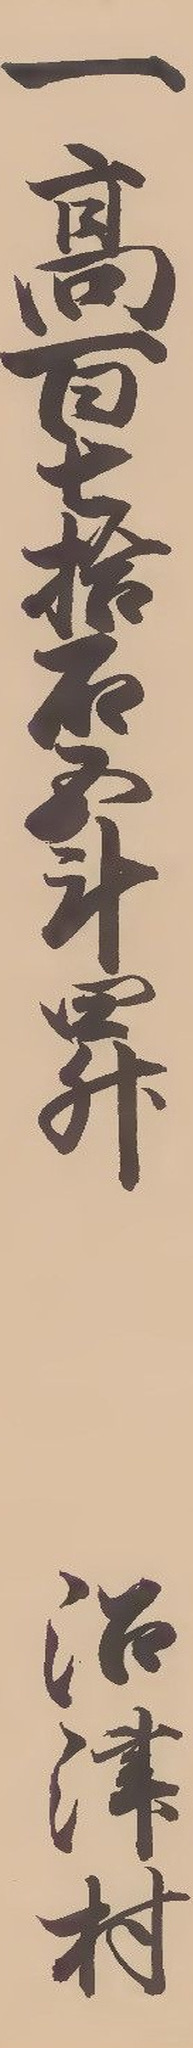一高百七拾石五斗四升沼津村

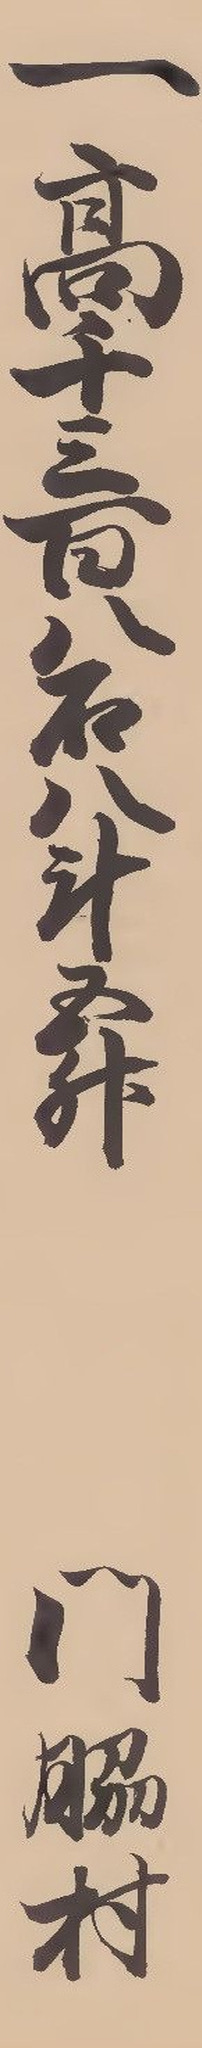一高千三百八石八斗五升門脇村
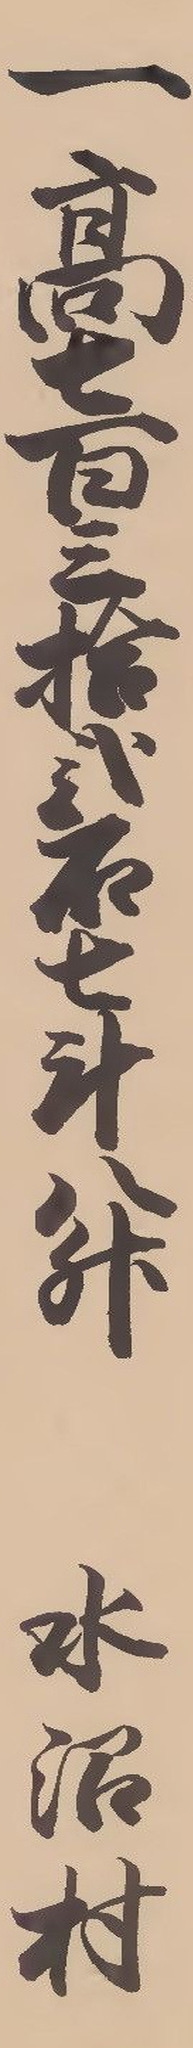一高七百三拾弐石七斗八升水沼村
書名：陸奥国郷帳　５
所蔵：国立公文書館 National Archives of Japan
